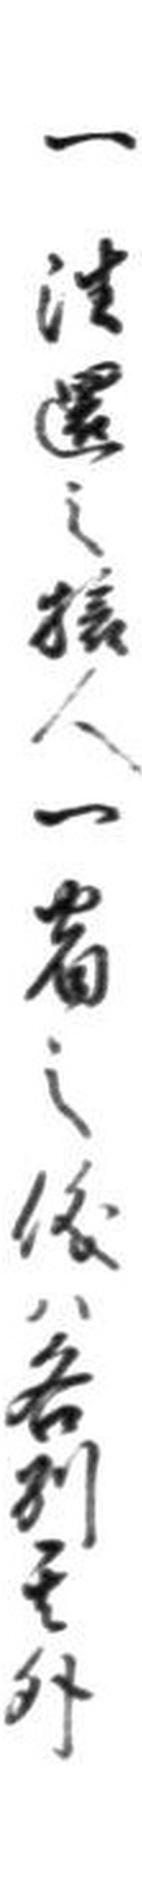一往還之旅人一宿之儀ハ格別其外
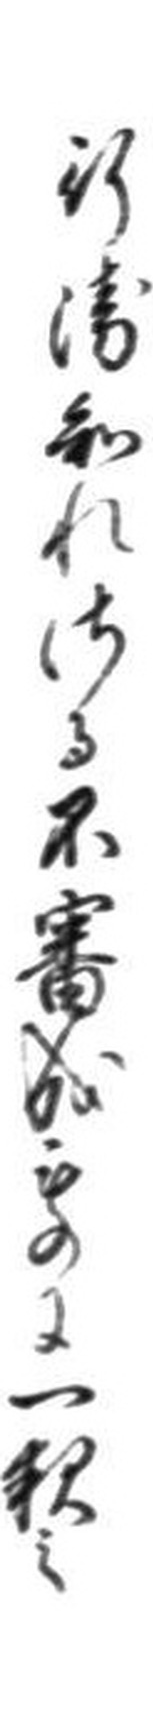行衛知れさる不審成ものに一夜之
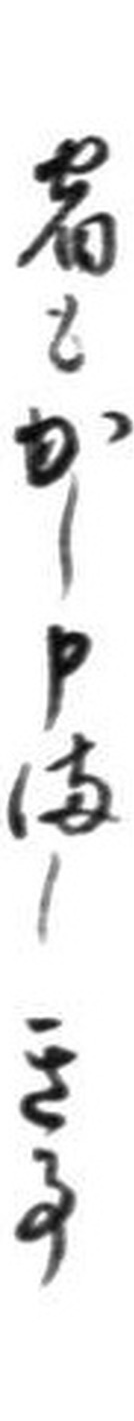宿もかし申ましき事
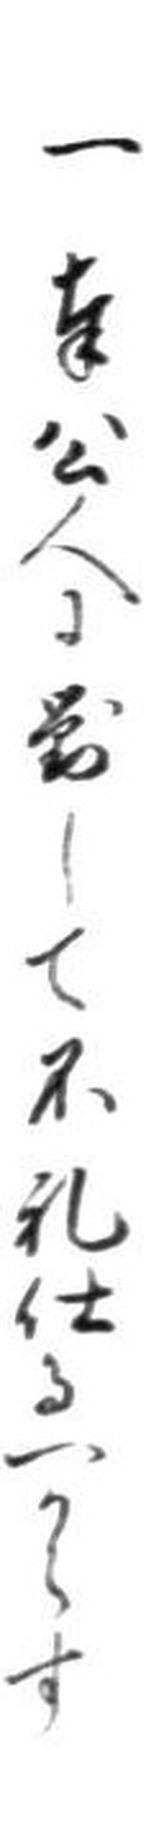一奉公人に対して不礼仕ろへからす
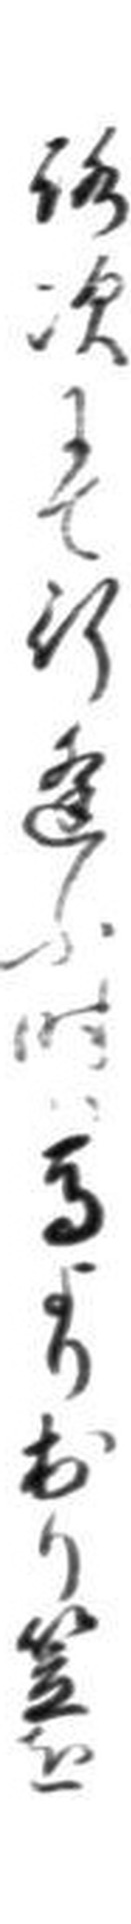路次にて行逢ふ時ハ馬よりおり笠を

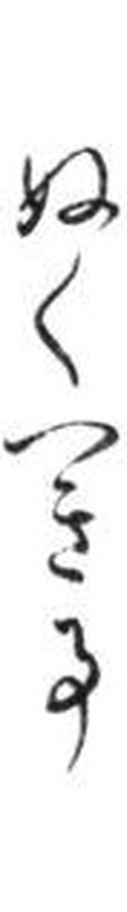ぬくへき事
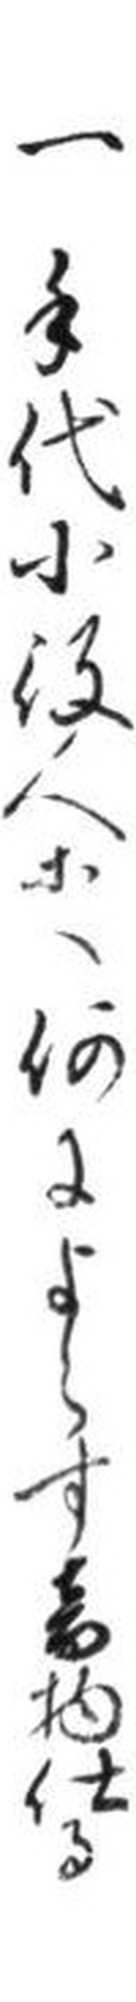一手代小役人等へ何によらす音物仕る
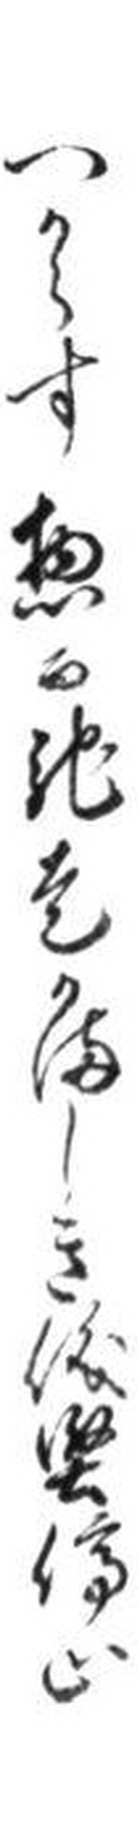へからす惣而馳走かましき儀堅停止
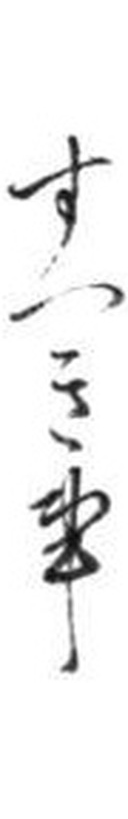すへき事
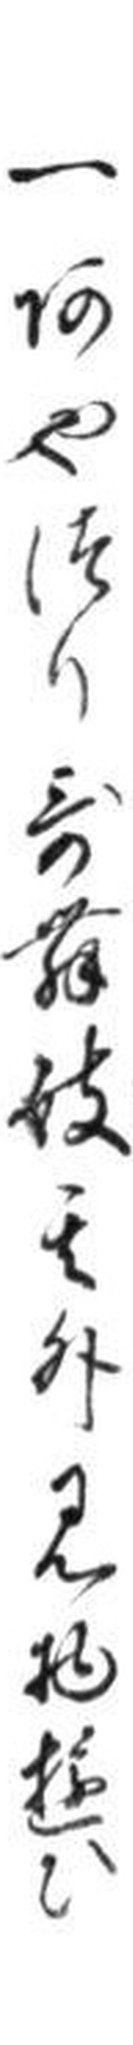一あやつり哥舞妓其外見物遊ひ
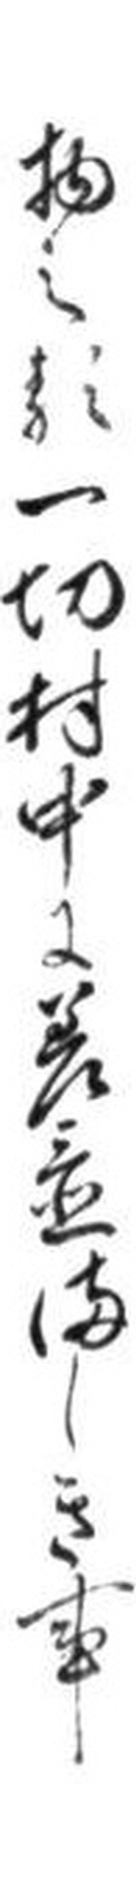物之類一切村中に差置ましき事
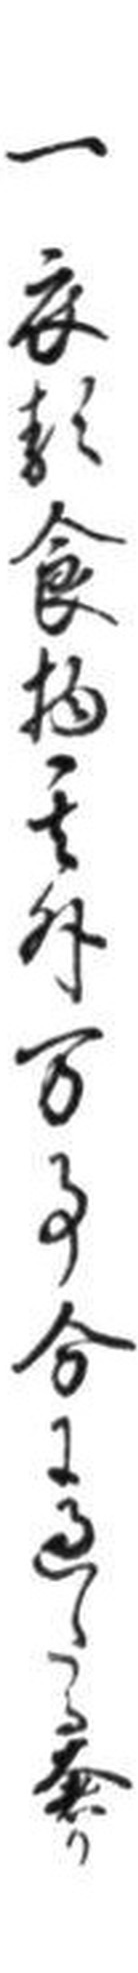一衣類食物其外万事分に過たる奢り
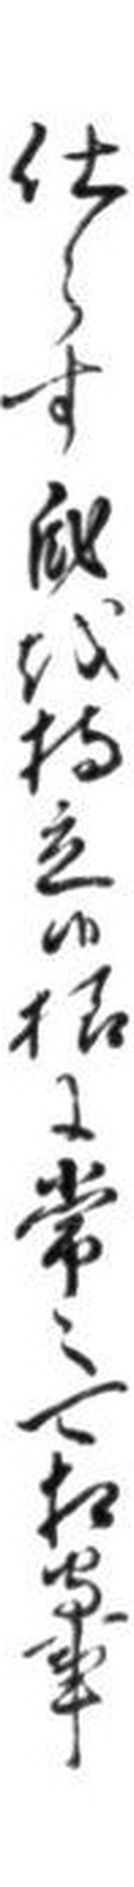仕らす身を持立候様に常々可相守事
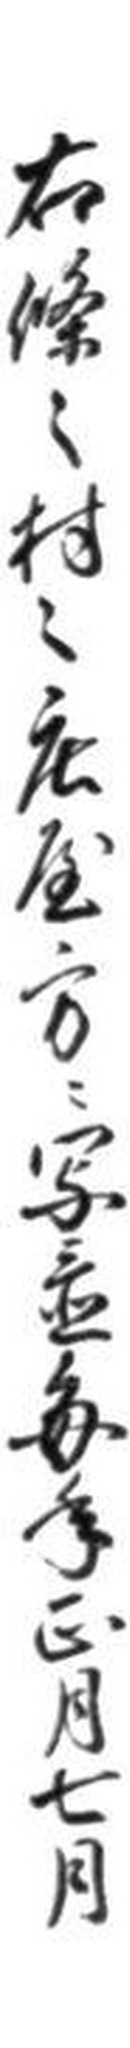右条々村々庄屋方ニ写置毎年正月七日
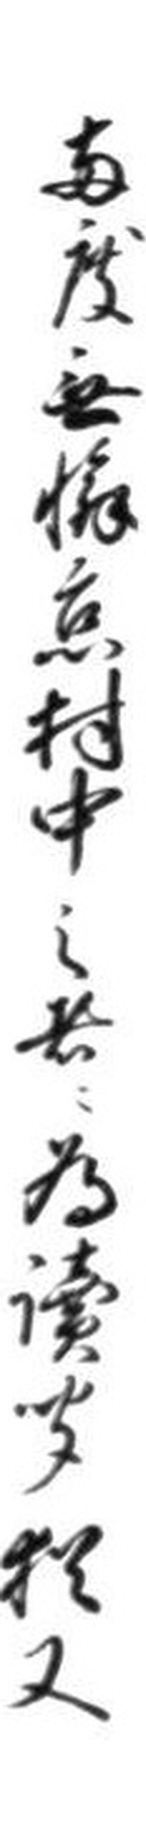両度無懈怠村中之者ニ為読聞猶又
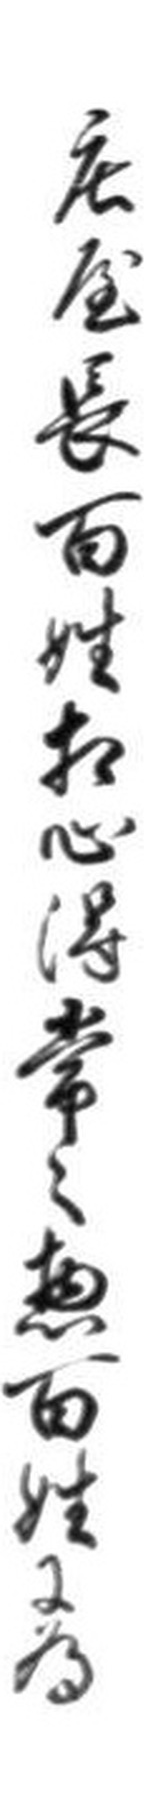庄屋長百姓相心得常々惣百姓に為
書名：家譜 十六 吉品公 従貞享三年閏三月到同四年
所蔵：福井県文書館 Fukui Prefectural Archives
